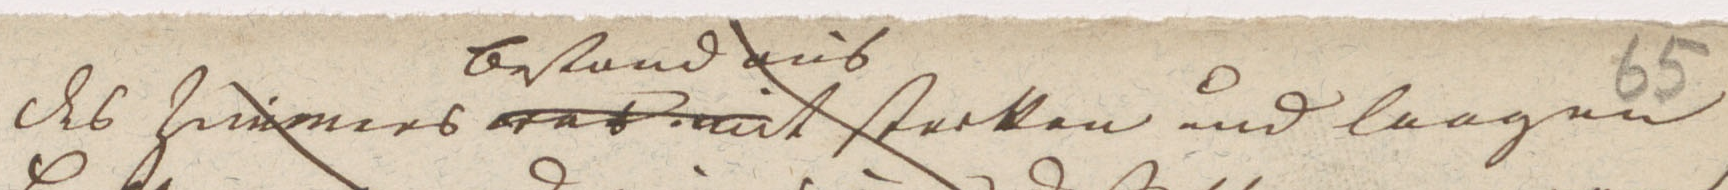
des Zimmers war mit bestand aus starken und langen
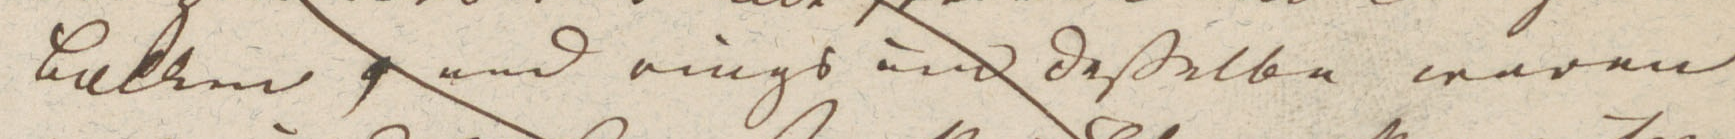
Balken und rings um dasselbe waren
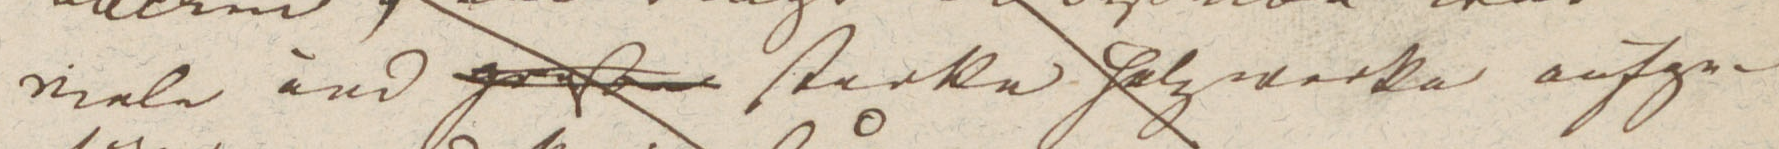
viele und grosse starke Holzwerke aufge-
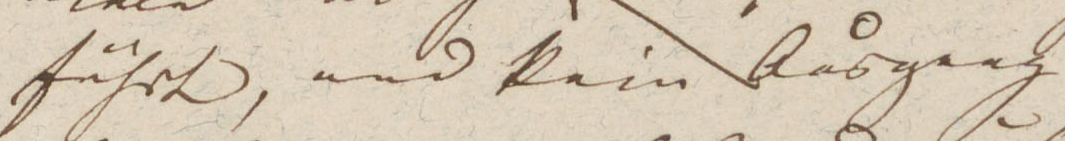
führt, und kein Ausgang
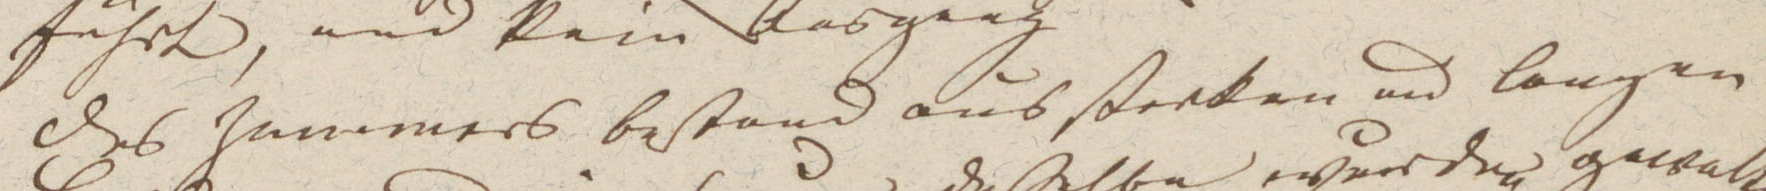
des Zimmers bestand aus starken und langen
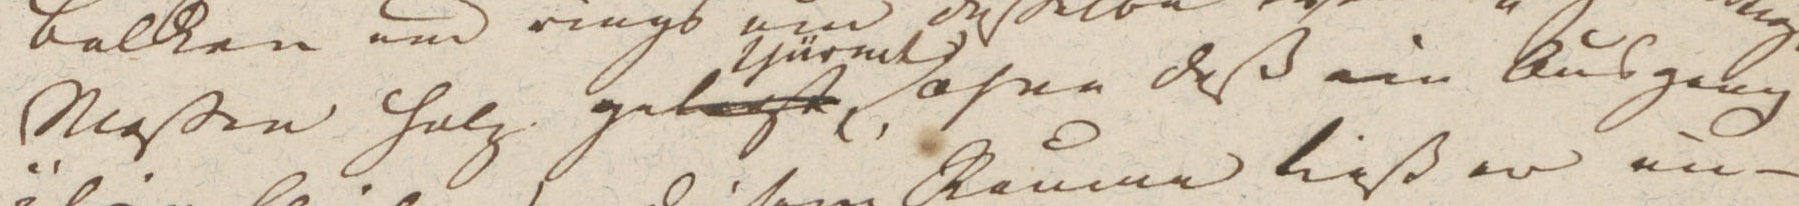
Massen Holz gelegtthürmt, ohne dass ein Ausgang
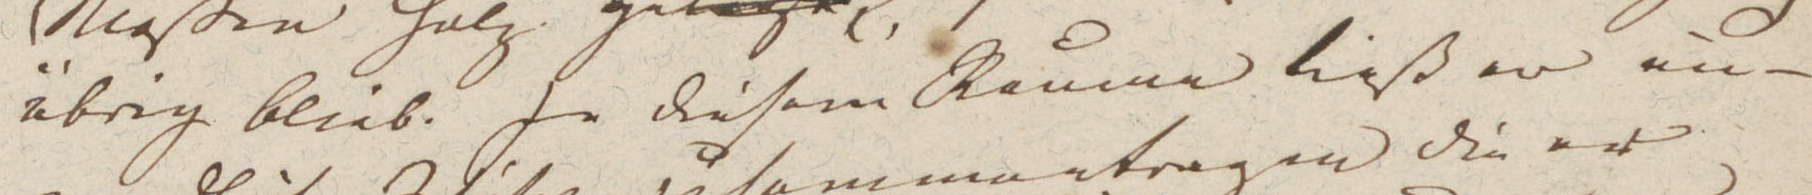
übrig blieb. In diesem Raume liess er un-
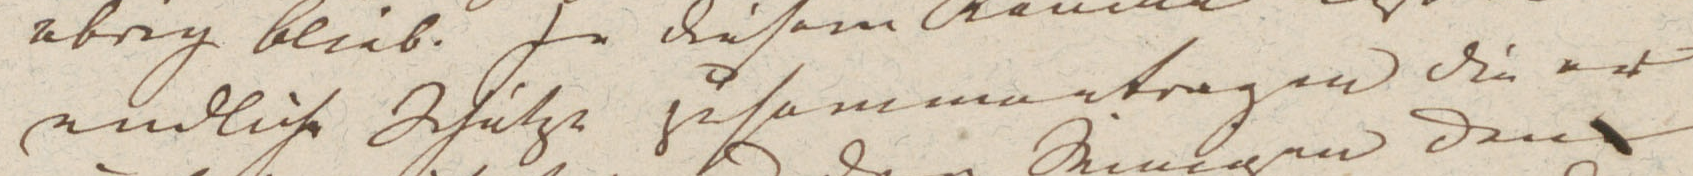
endliche Schütze zusammentragen die er
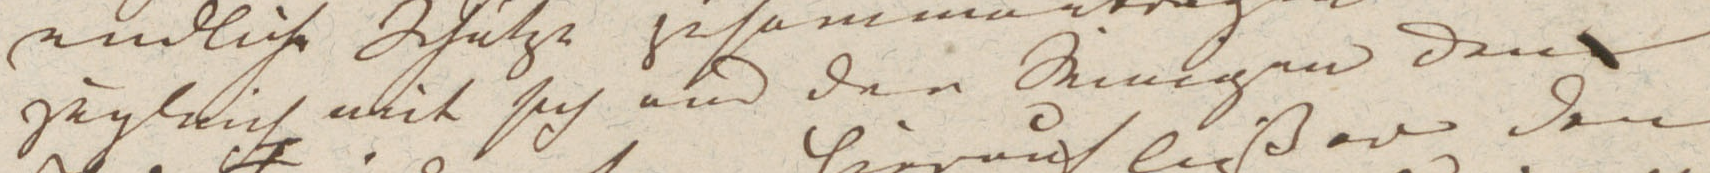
zugleich mit sich und den Seinigen demn
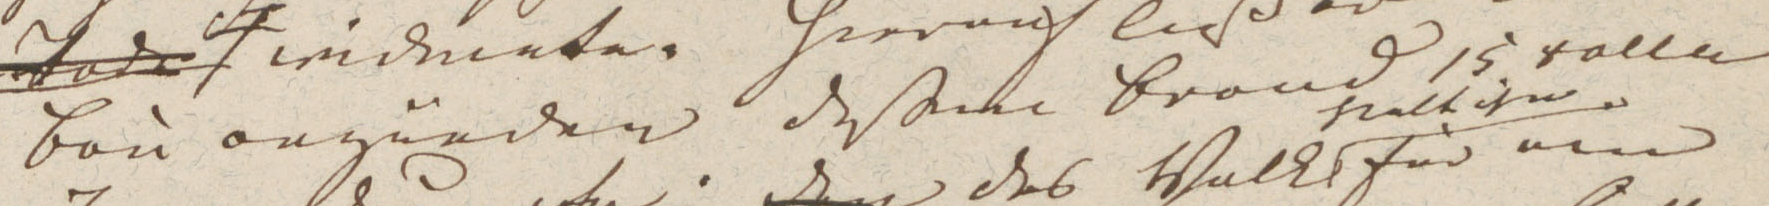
Bau anzünden dessen Brand 15 volle
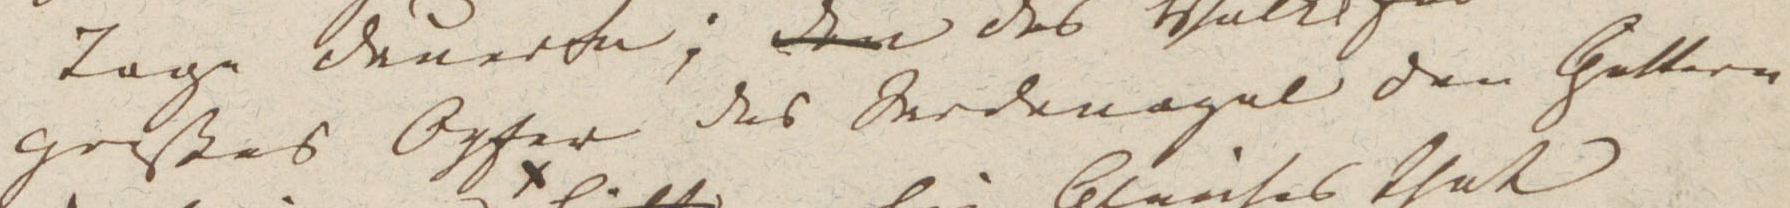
grosses Opfer das Sardanapal den Göttern
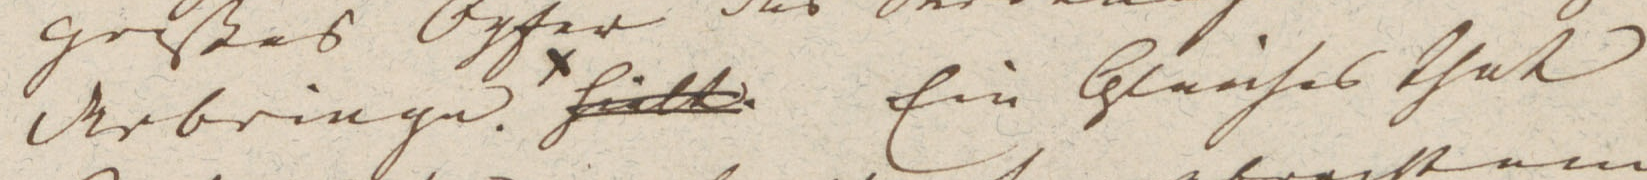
darbringe. % hielt. Ein Gleiches that
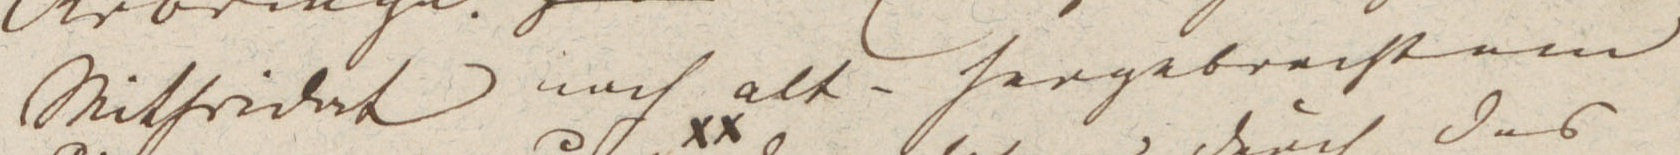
Mithridat nach alt-hergebrachtem
